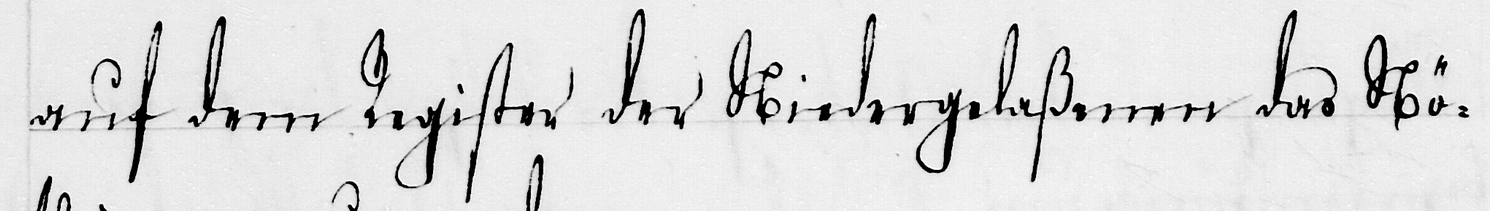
auf dem Register der Niedergelaßenen das Nö¬
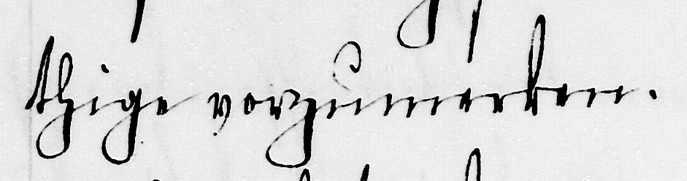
thige vorzumerken.
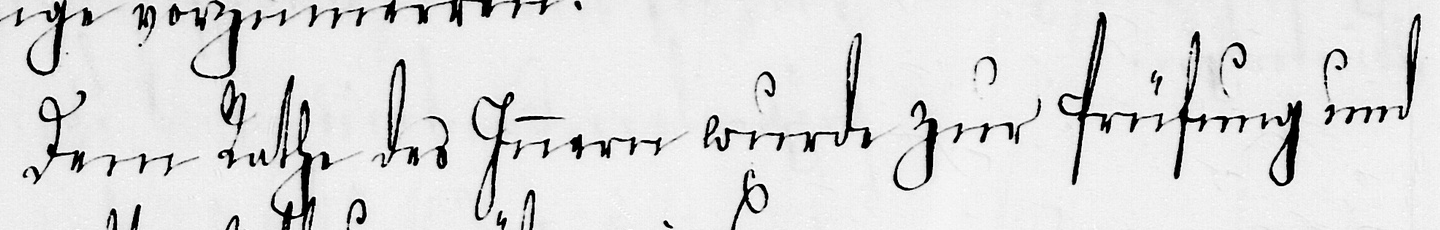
Dem Rathe des Innern wurde zur Prüfung und
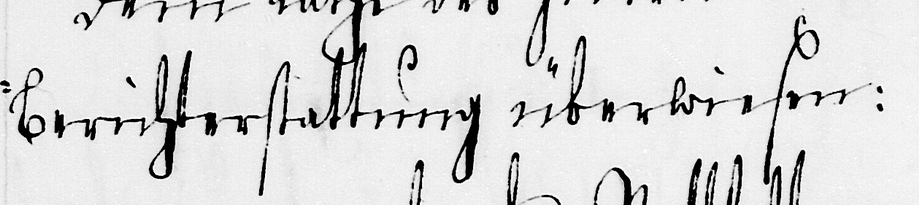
Berichterstattung überwiesen:
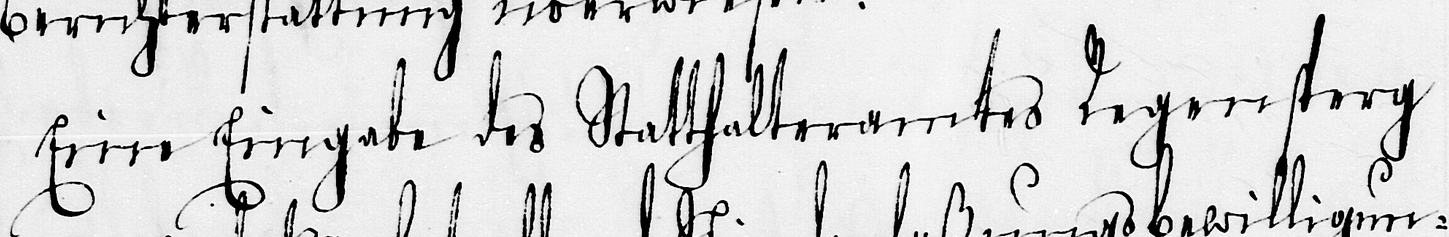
Eine Eingabe des Statthalteramtes Regensperg
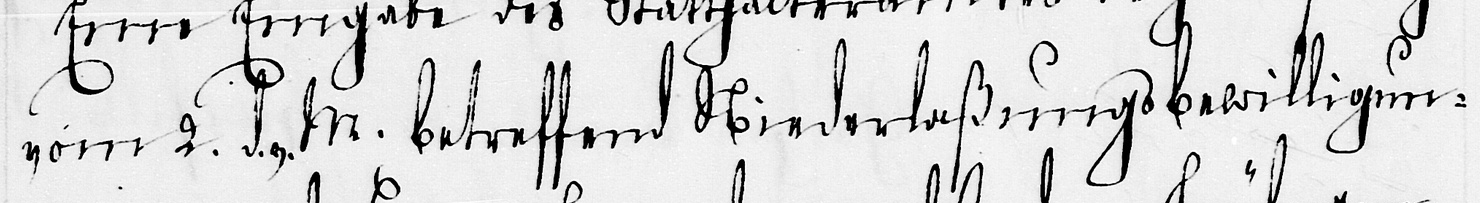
vom 2. d. v. M. betreffend Niederlaßungsbewilligun¬
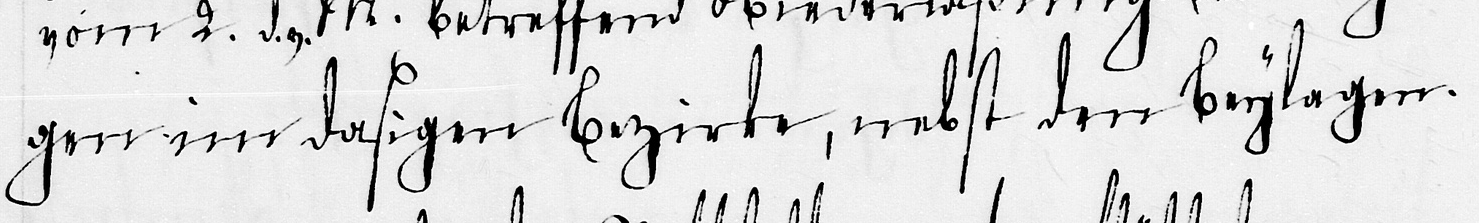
gen im dasigen Bezirke, nebst den Beylagen.
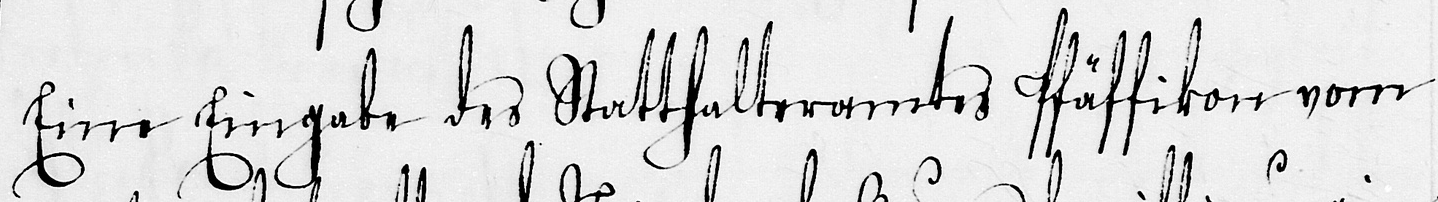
Eine Eingabe des Statthalteramtes Pfäffikon vom
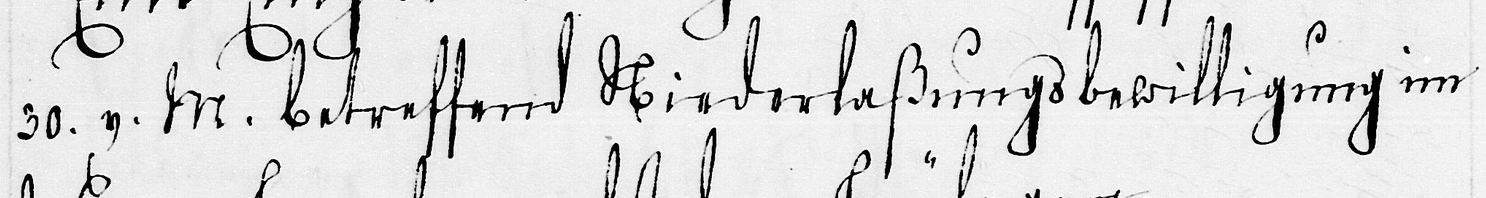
30. v. M. betreffend Niederlaßungsbewilligung im
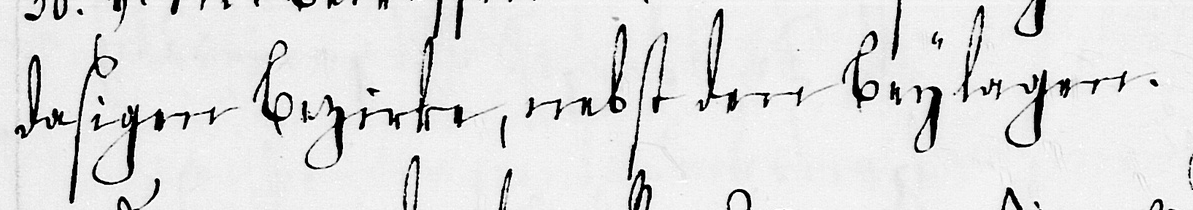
dasigen Bezirke, nebst den Beylagen.
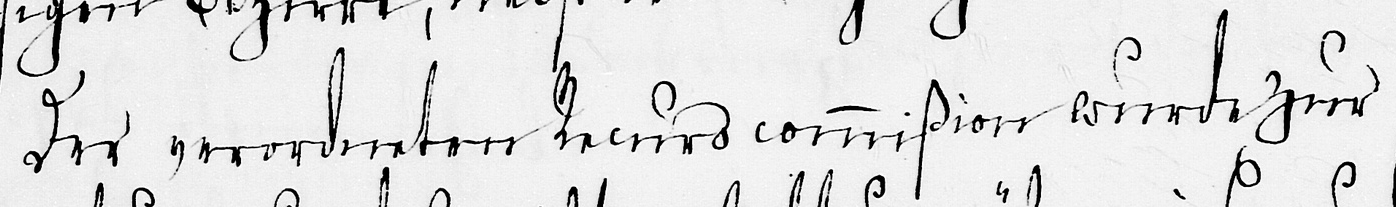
Der verordneten Recurscommißion wurde zur
